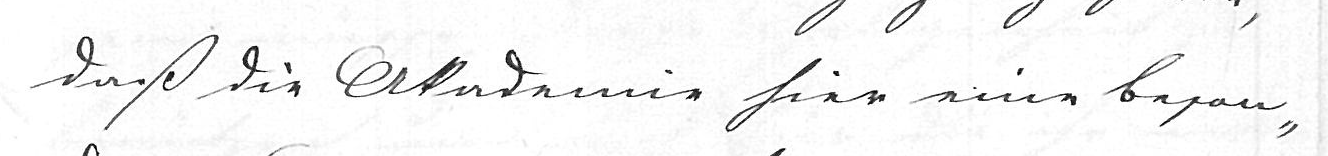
daß die Akademie hier eine beson-
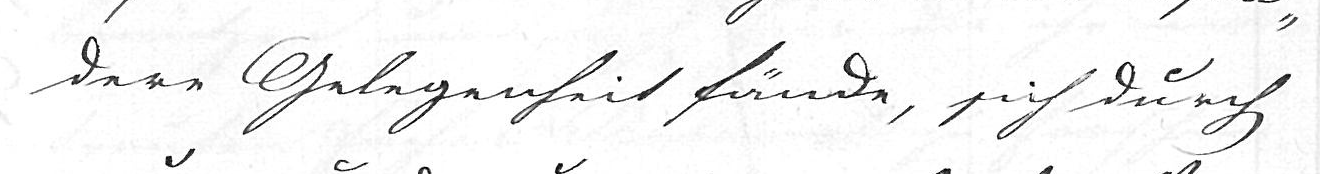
dere Gelegenheit fände, sich durch
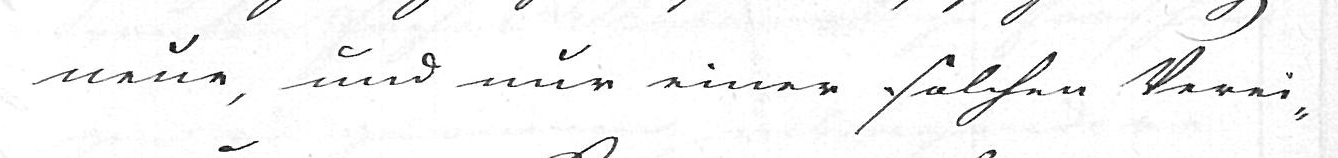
neue, und nur einer solchen Verei-
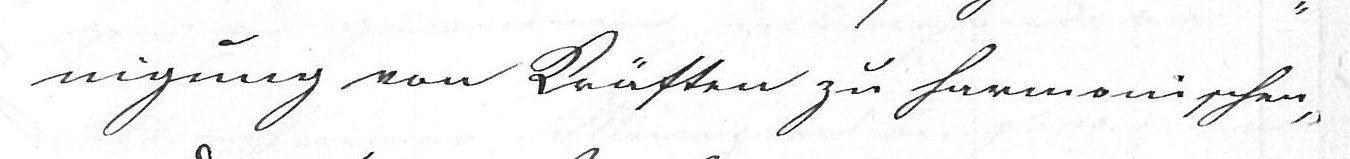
nigung von Kräften zu harmonischen,
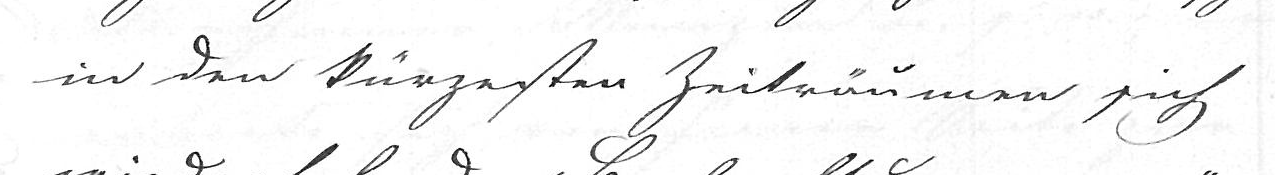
in den kürzesten Zeiträumen sich
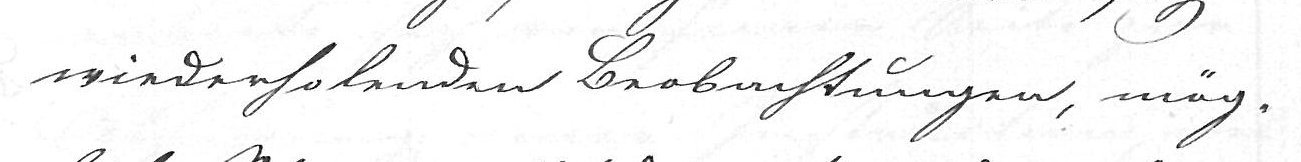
wiederholenden Beobachtungen, mög-
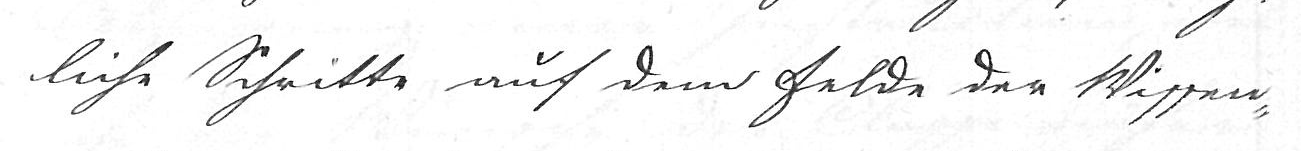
liche Schritte auf dem Felde der Wissen-
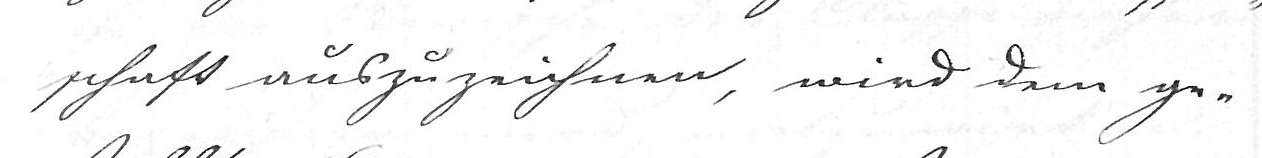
schaft auszuzeichnen, wird dem ge-
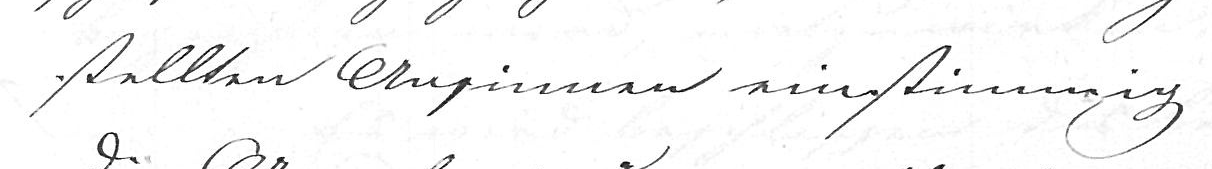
stellten Ansinnen einstimmig
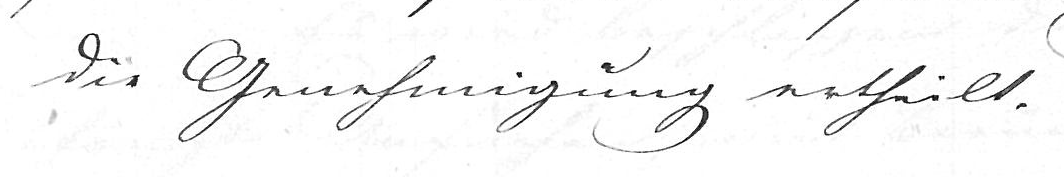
die Genehmigung ertheilt.
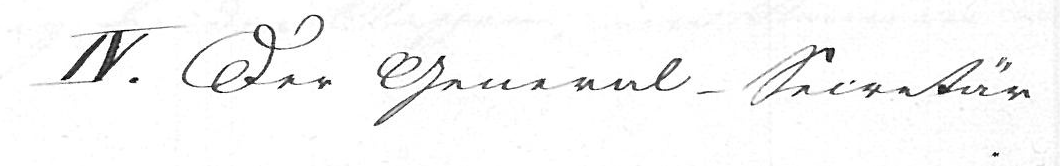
IV. Der General-Secretär
